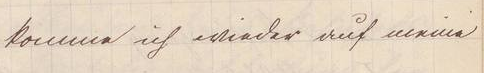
komme ich wieder auf meine
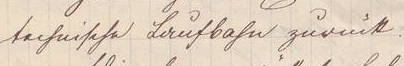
technische Laufbahn zurück.
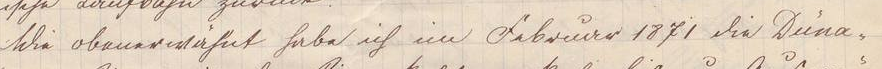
Wie obenerwähnt habe ich im Februar 1871 die Düna-
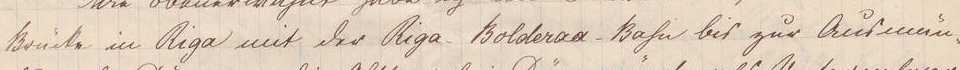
Brücke in Riga mit der Riga–Bolderaa-Bahn bis zur Ausmün-
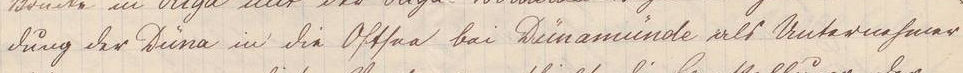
dung der Düna in die Ostsee bei Dünamünde als Unternehmer
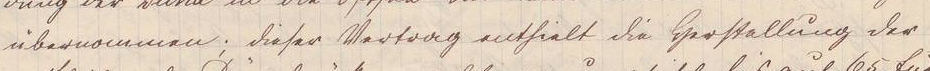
übernommen; dieser Vertrag enthielt die Herstellung der
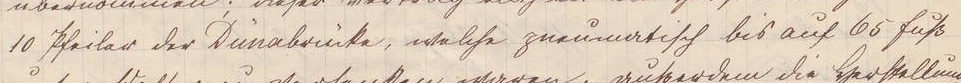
10 Pfeiler der Dünabrücke, welche pneumatisch bis auf 65 Fuß
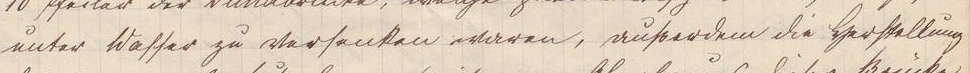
unter Wasser zu versenken waren, außerdem die Herstellung
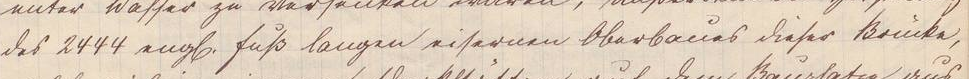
des 2444 engl. Fuß langen eisernen Oberbaues dieser Brücke,
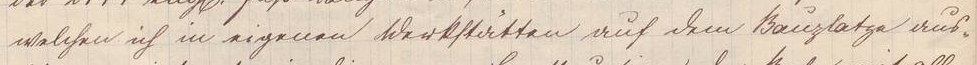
welchen ich in eigenen Werkstätten auf dem Bauplatze ans
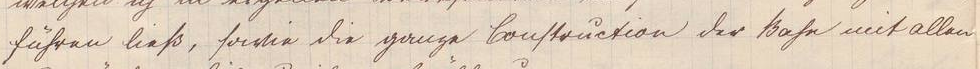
führen ließ, sowie die ganze Construction der Bahn mit allen
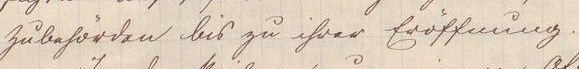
Zubehörden bis zu ihrer Eröffnung.
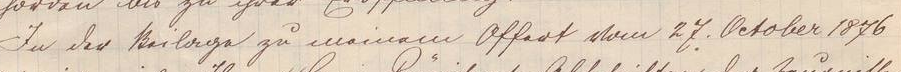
In der Beilage zu meinem Offert vom 27. October 1876
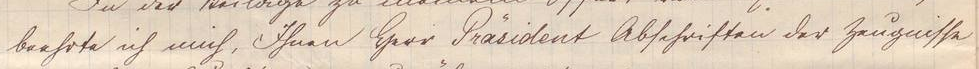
beehrte ich mich, Ihnen Herr Präsident Abschriften der Zeugnisse
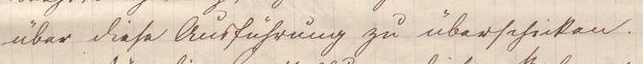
über diese Ausführung zu überschicken.
